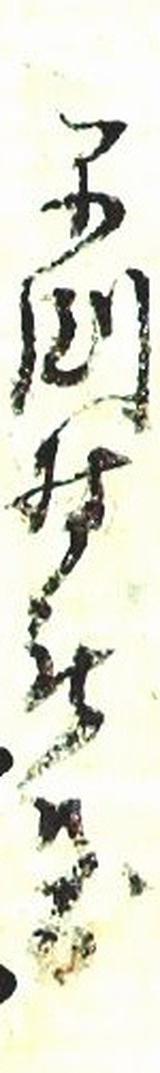早淵村庄屋
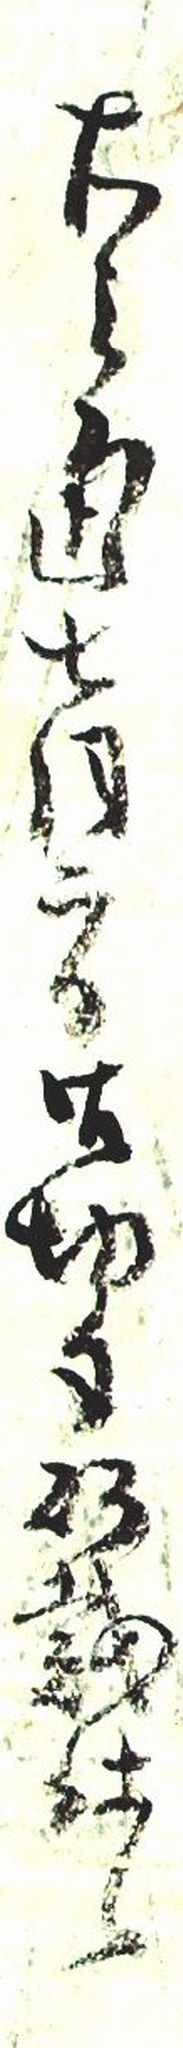右之通七月二日御切手頂戴仕候
